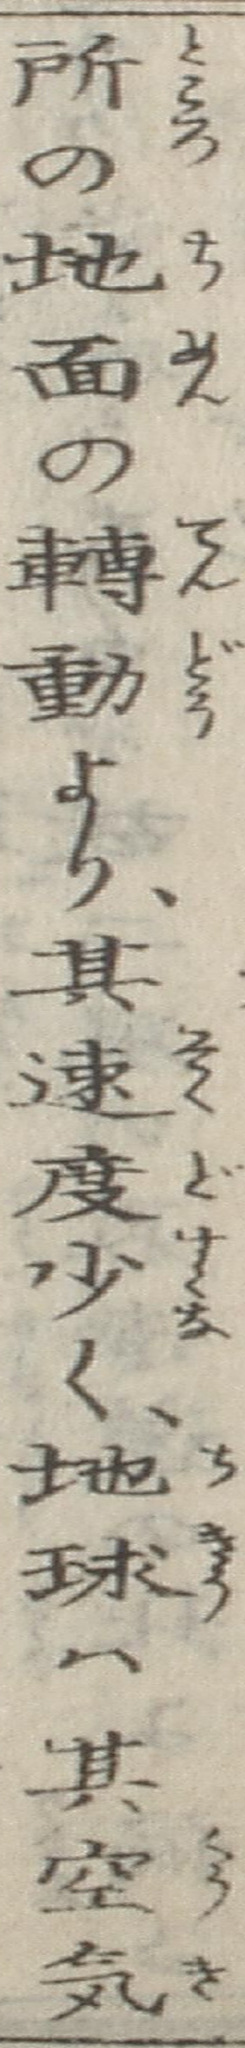所の地面の転動より、其速度少く、地球は其空気
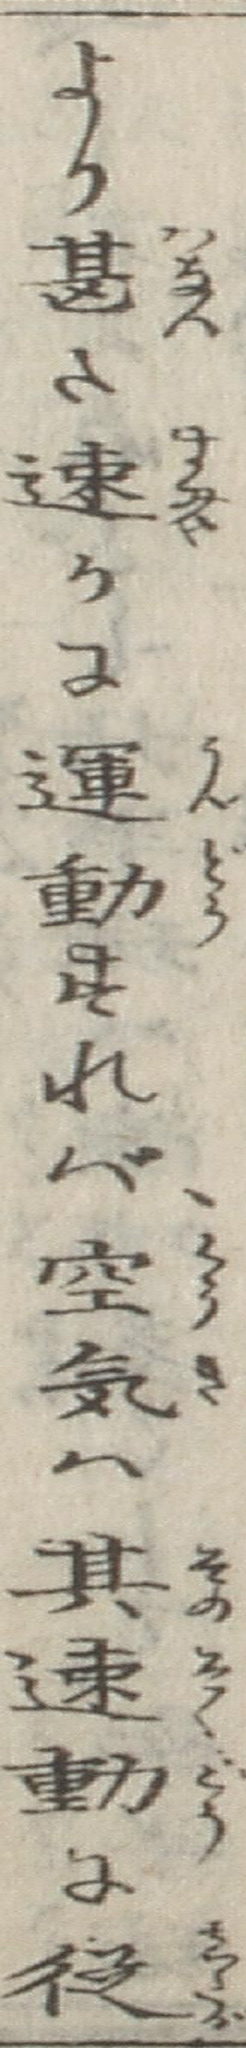より甚た速かに運動すれば、空気は其速動に従
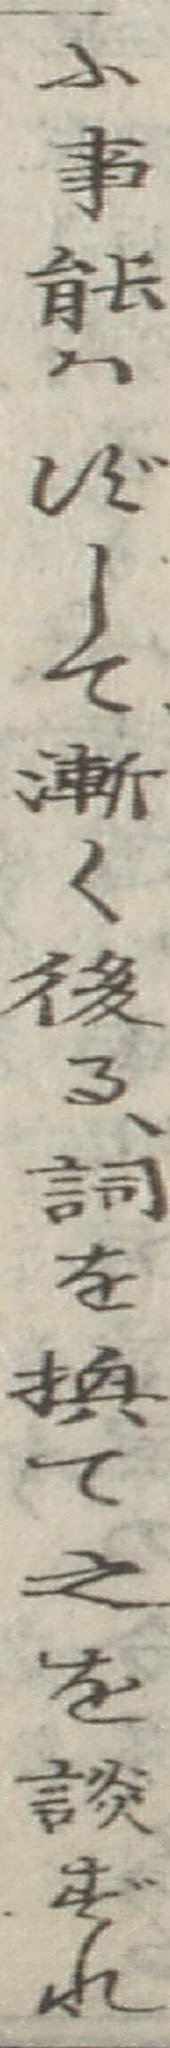ふ事能はずして、漸く後る、詞を換て之を談ずれ
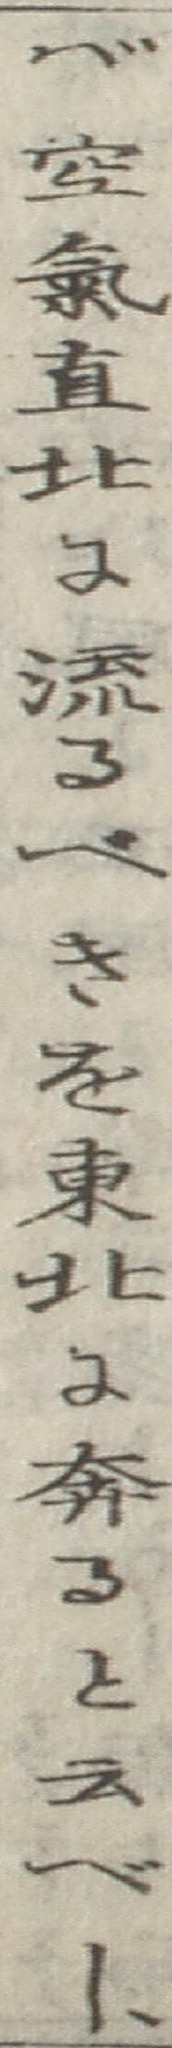ば空気直北に流るべきを東北に奔ると云べし、
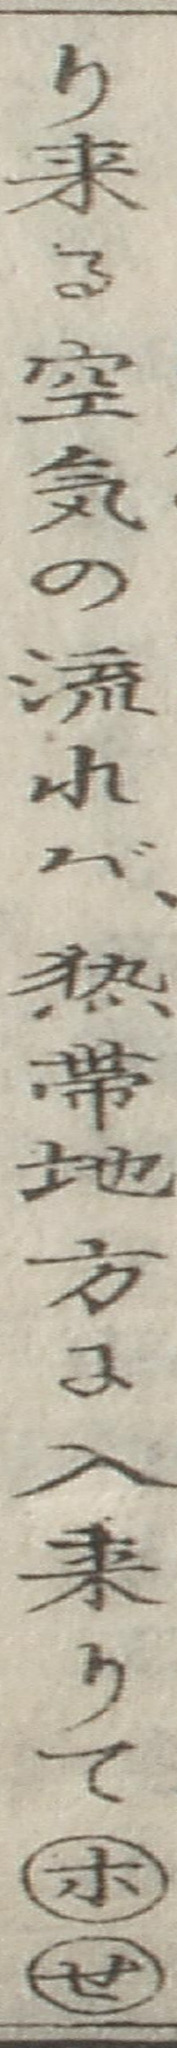り来る空気の流れば、熱帯地方に入来りて、ホせ
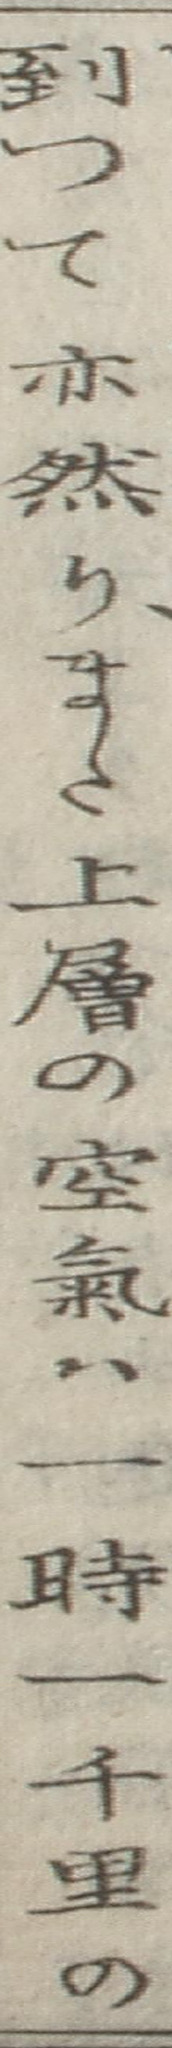到つて亦然り、また上層の空気は、一時一千里の

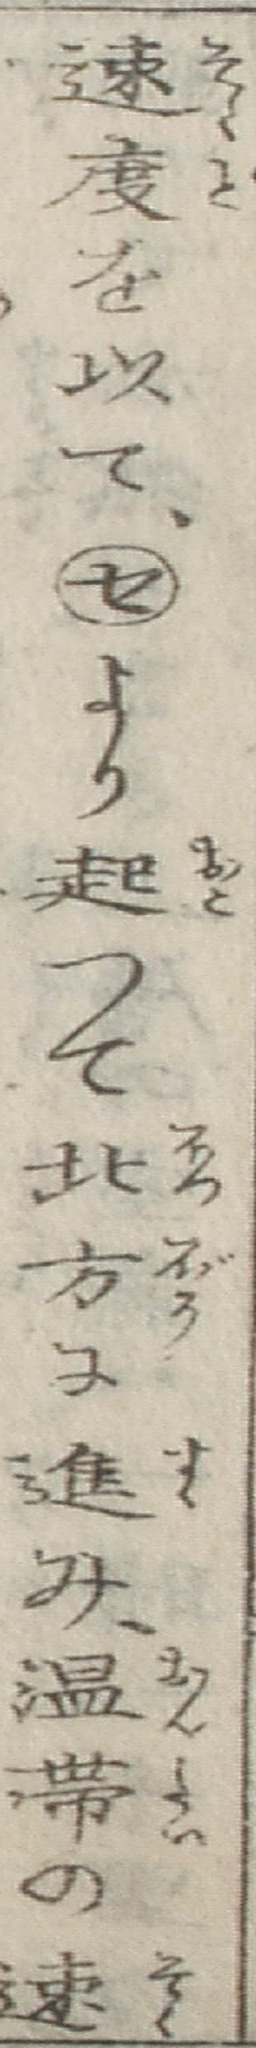速度を以て、セより起つて北方に進み、温帯の速
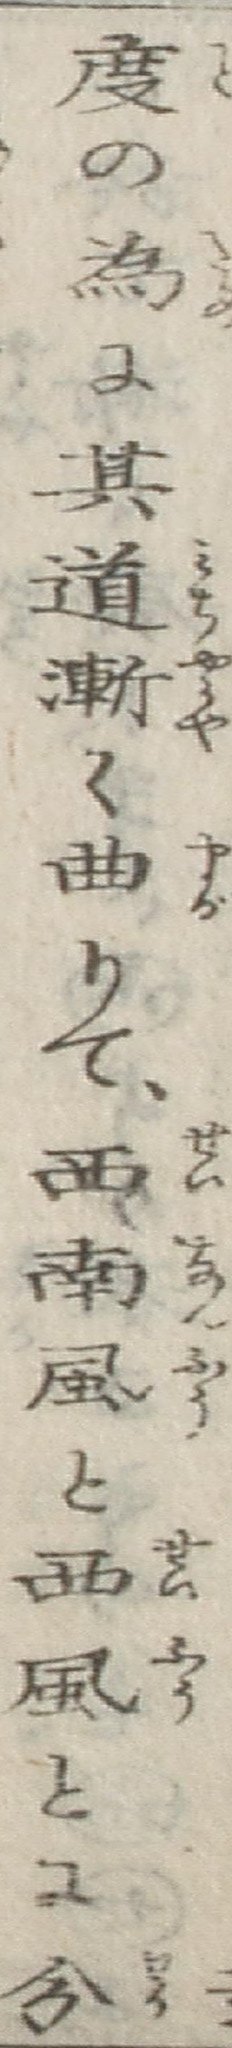度の為に其道漸く曲りて、西南風と西風とに分
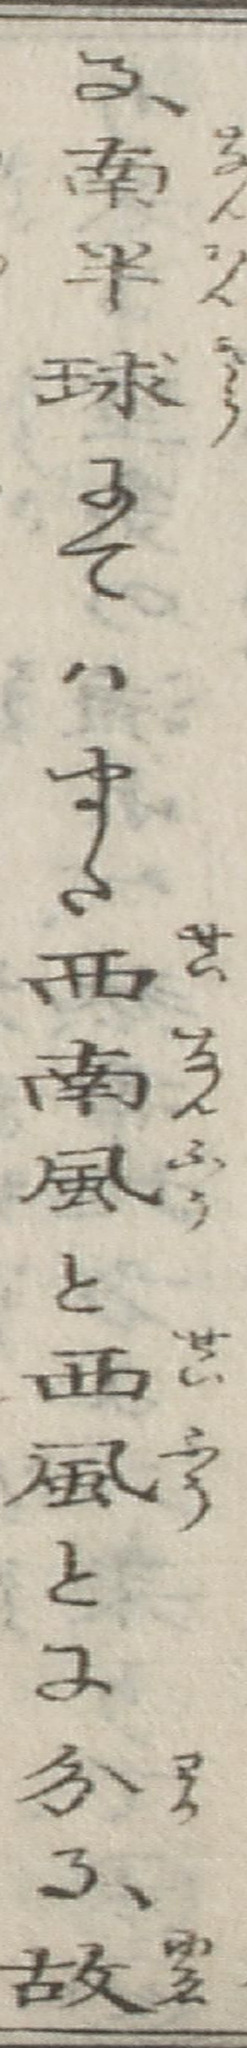る、南半球にてはまた西南風と西風とに分る、故
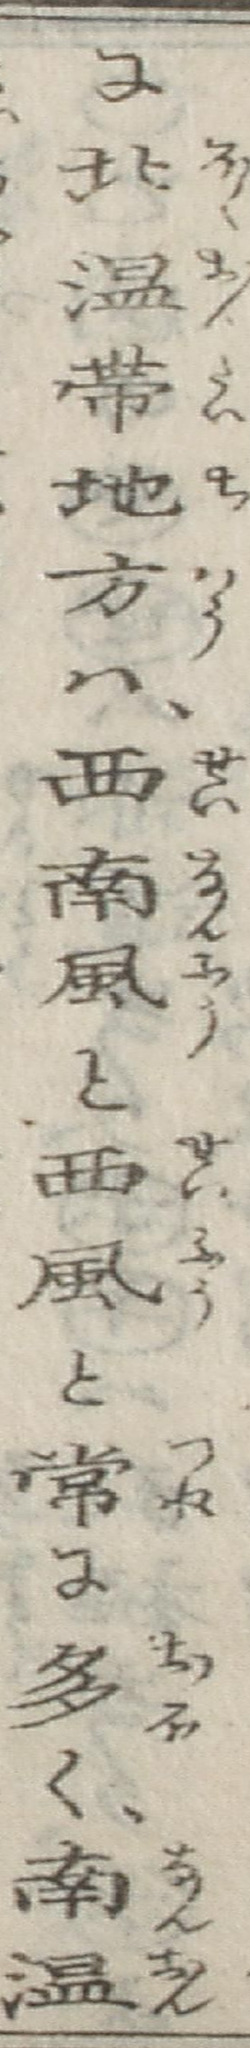に北温帯地方は西南風と西風と常に多く、南温
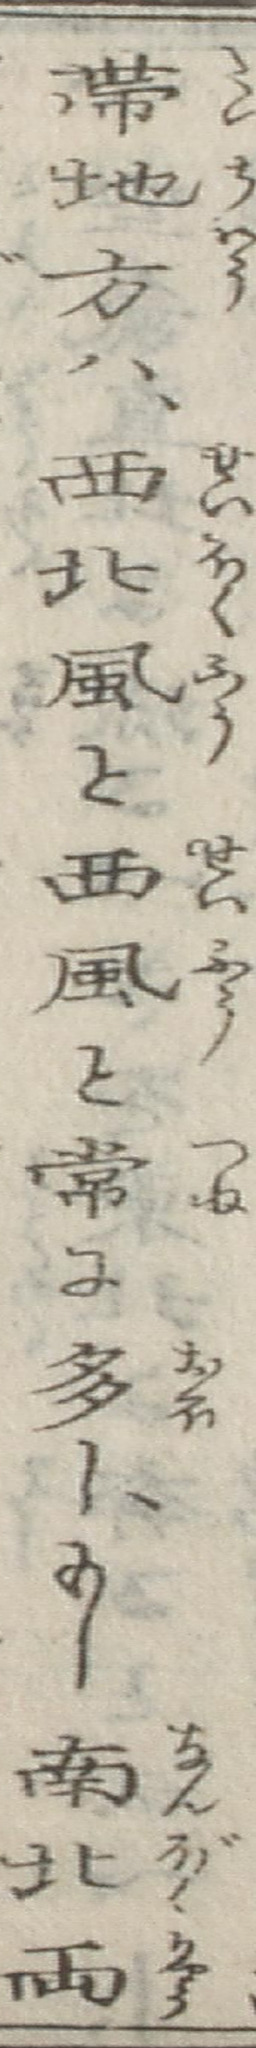帯地方は、西北風と西風と常に多し、もし南北両
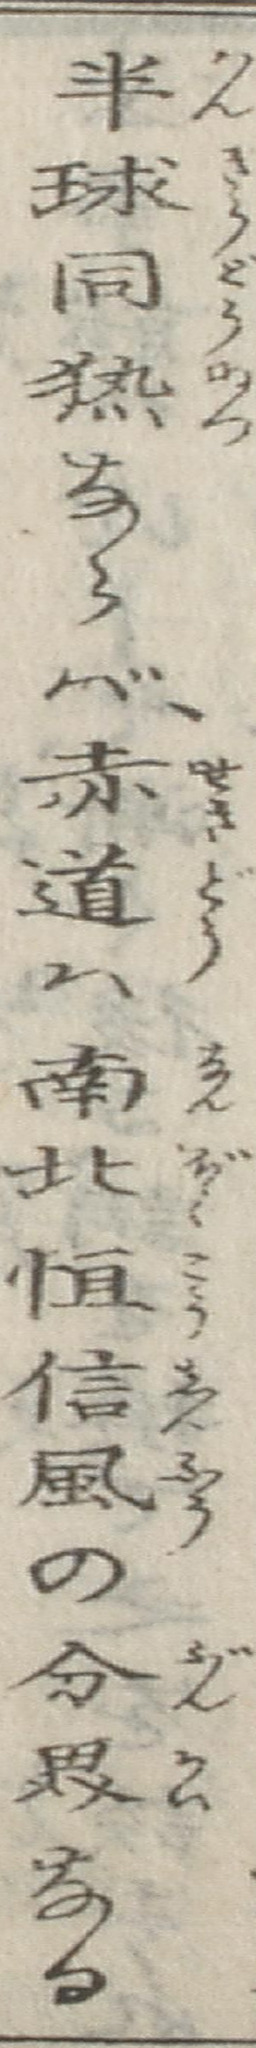半球同熱ならば、赤道は南北恒信風の分界なる
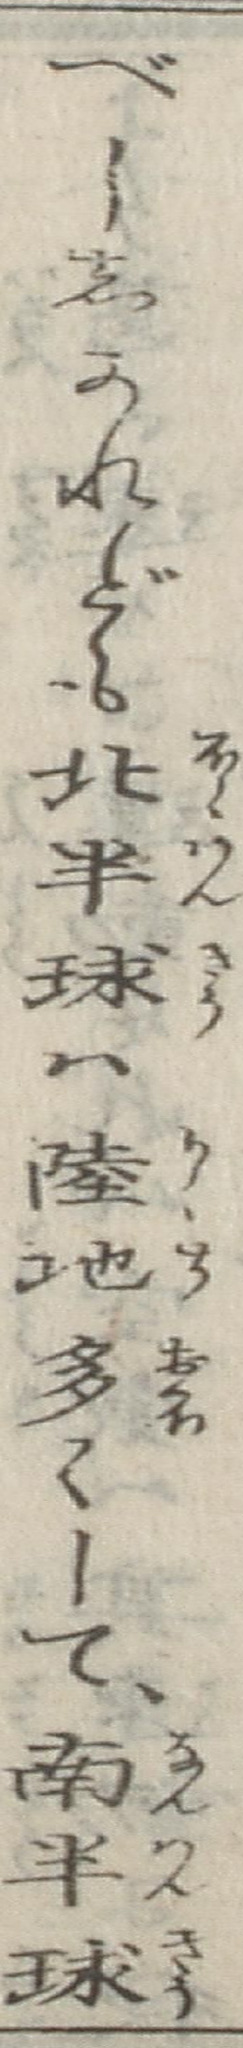べししかれども北半球は陸地多くして、南半球
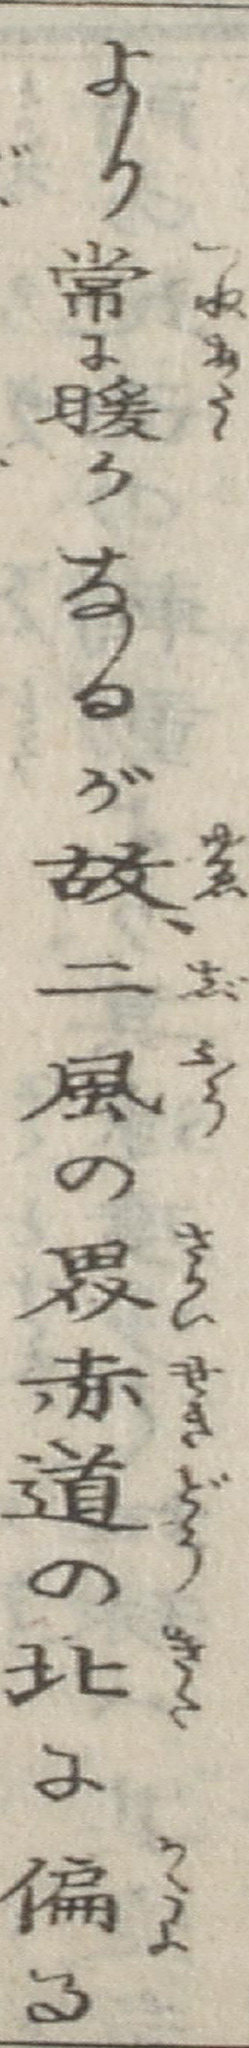より常に暖かなるが故、二風の界赤道の北に偏る
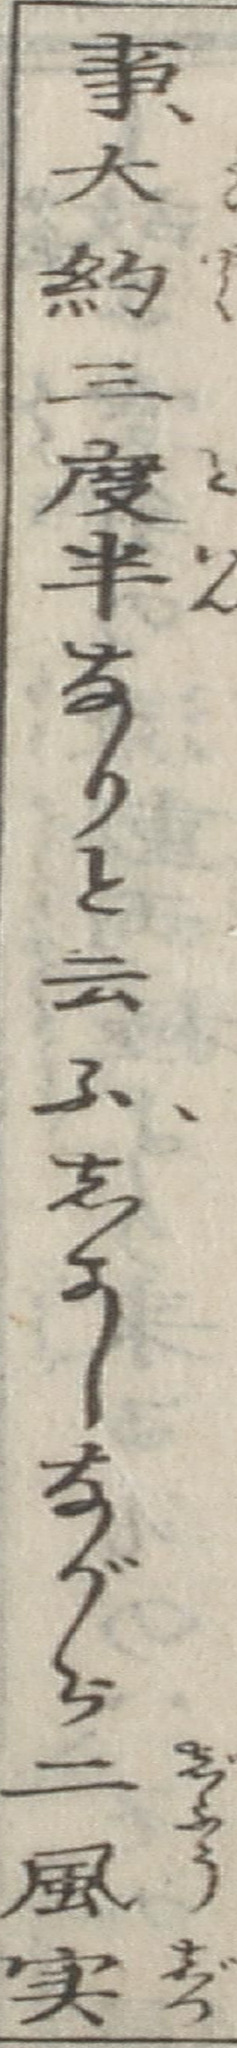事、大約三度半なりと云ふ、しかしながら二風実
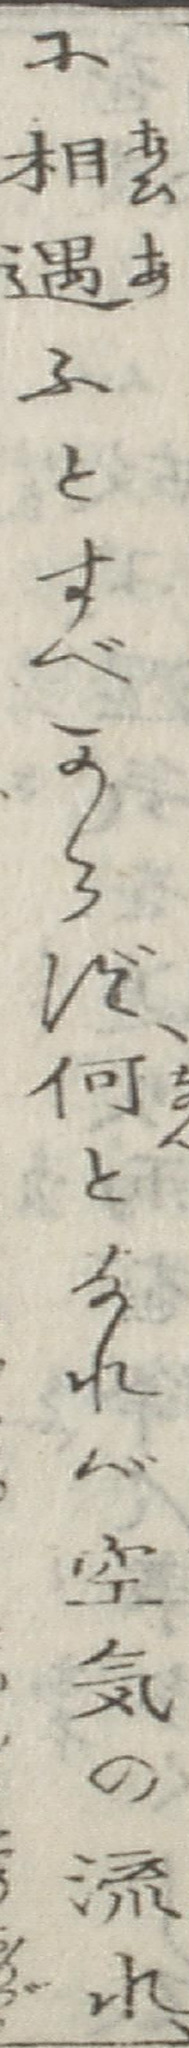に相遇ふとすべからず、何となれば空気の流れ、
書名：訓蒙　天然地理學　中
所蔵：東京大学地震研究所図書室 Earthquake Research Institute Library, The University of Tokyo, JAPAN
